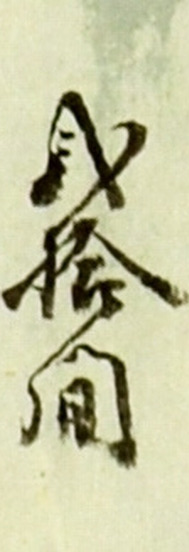弐拾間
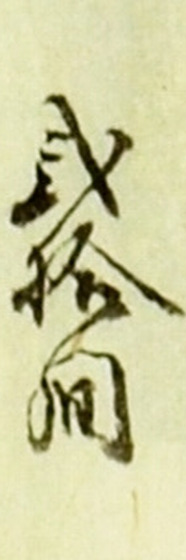弐拾間
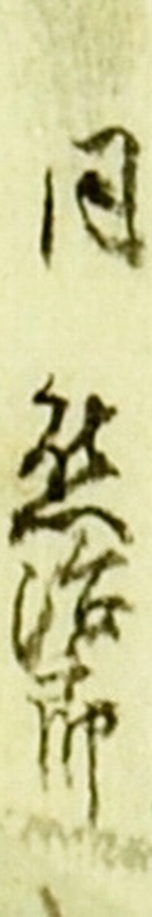同熊治郎
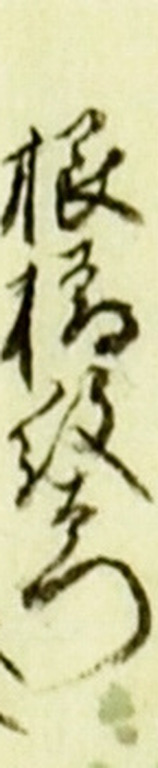根橋紋右衛門

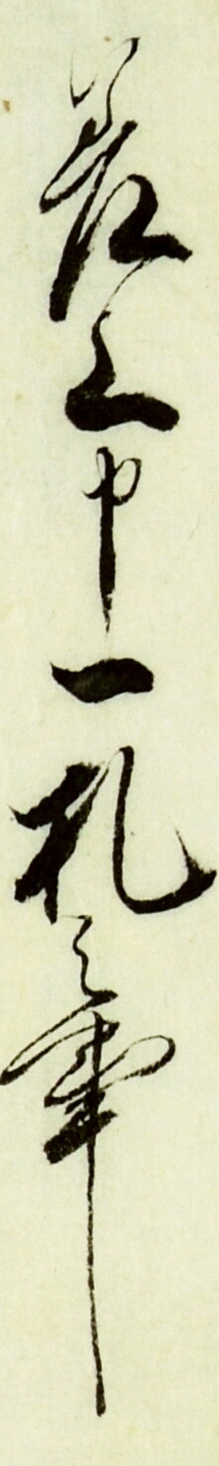差上申一札之事
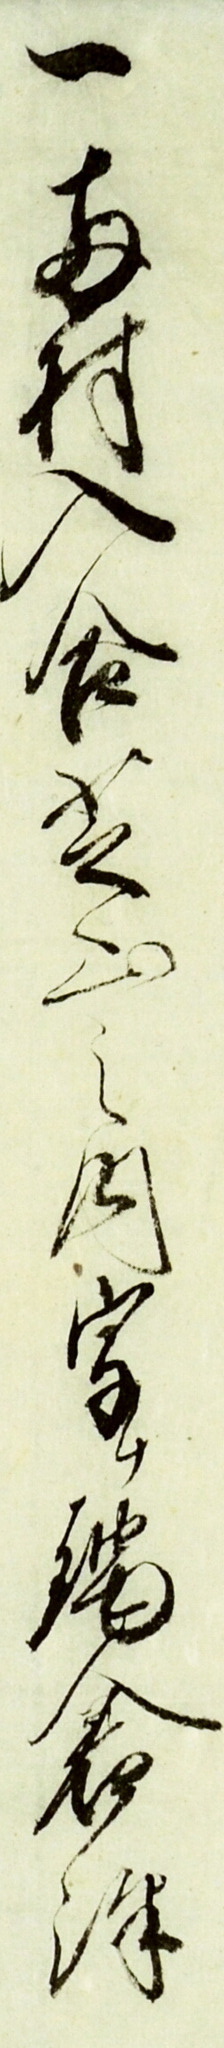一両村入合芝山之内字ヲ鍋倉沢
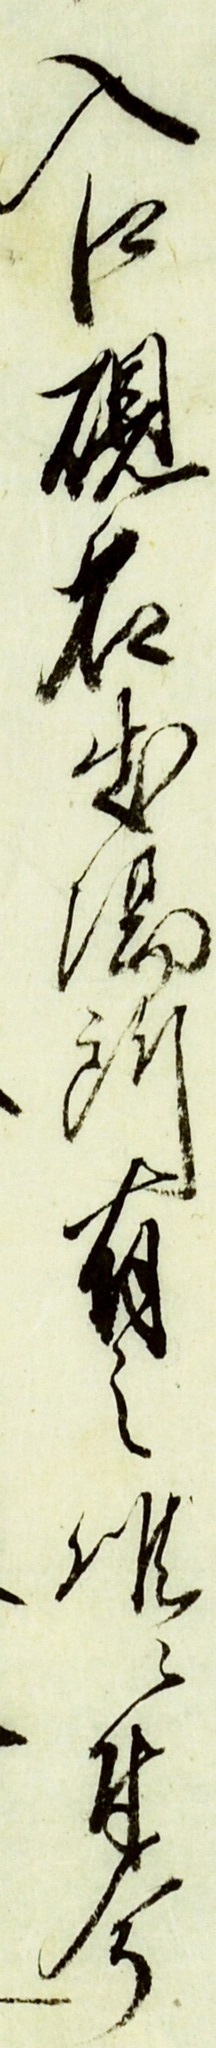入口硯石出場所有之候ニ付今
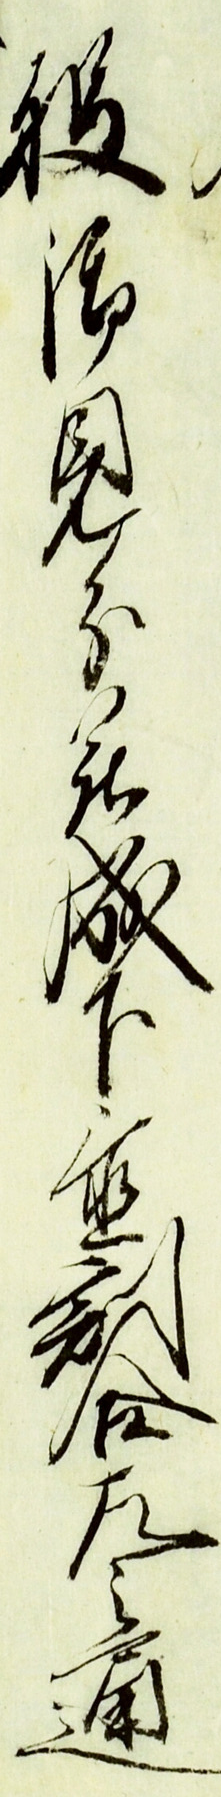般御見分被成下置割合左之通
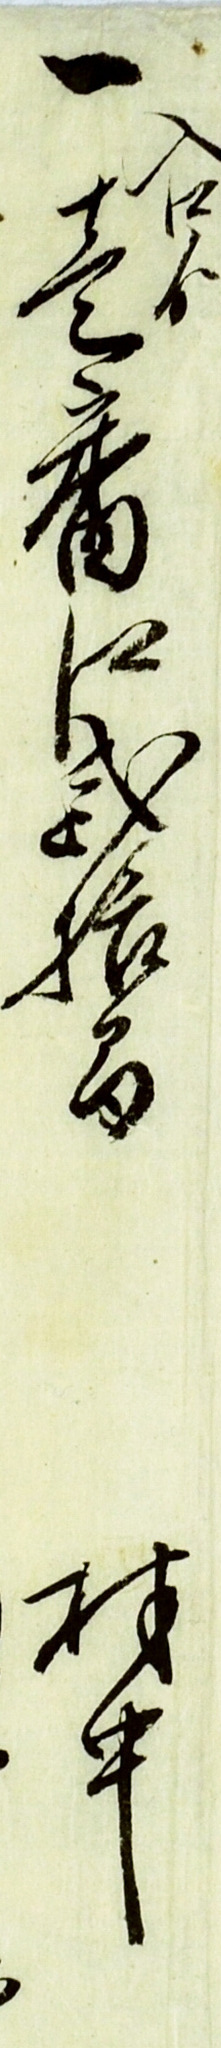一壱番口弐拾間村中
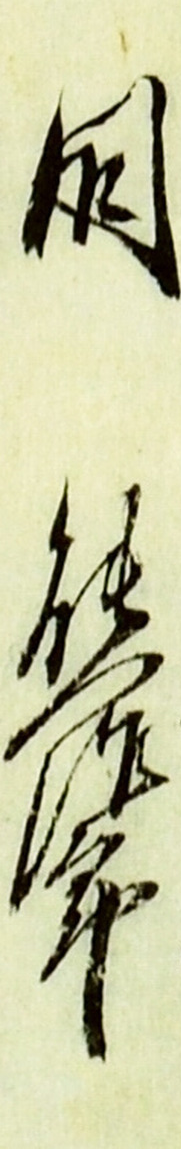同熊治郎
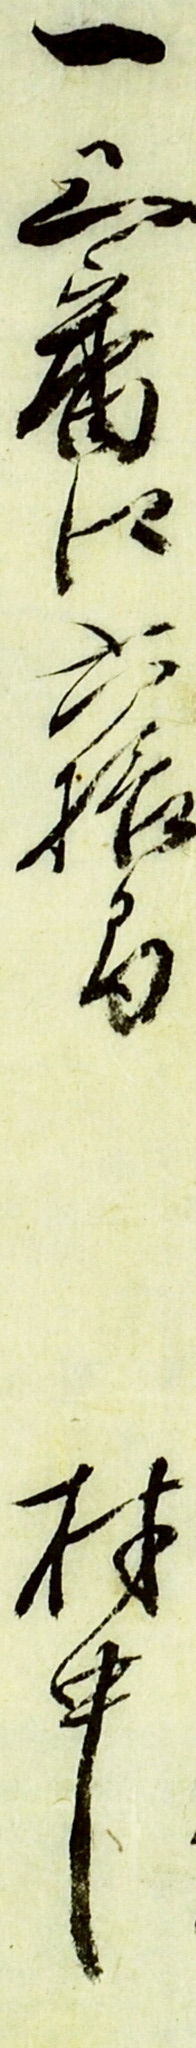一三番口六拾間村中
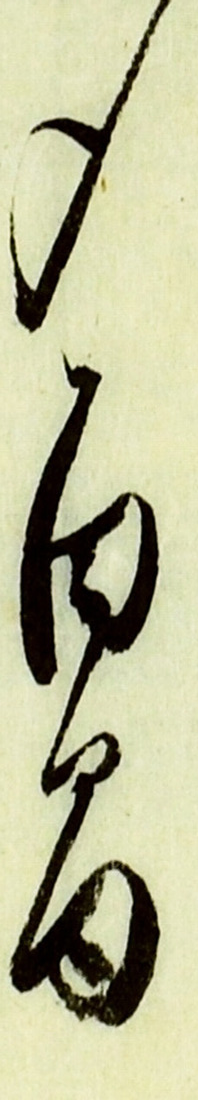〆百間
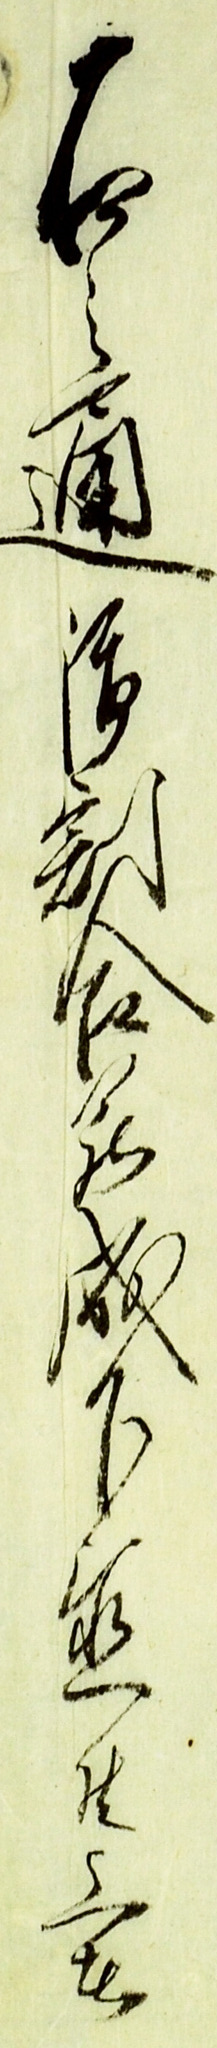右之通御割合被成下置候上者
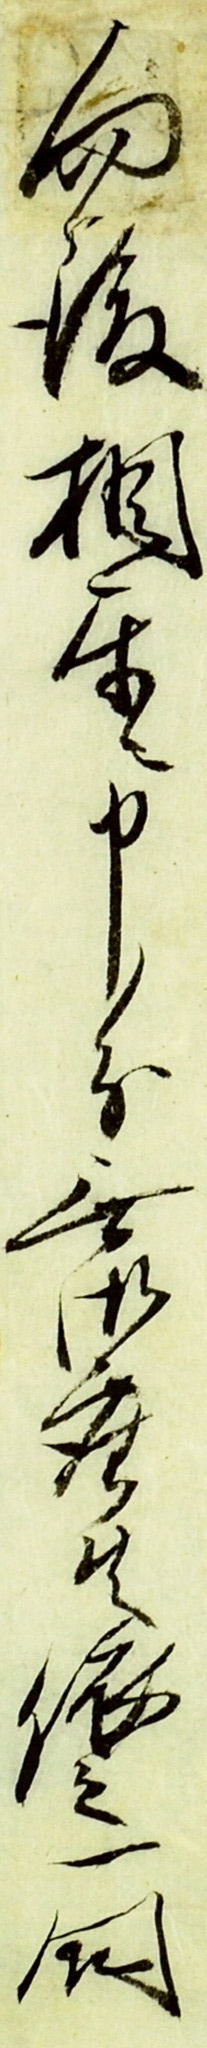向後相互ニ申分無御座候依之一同
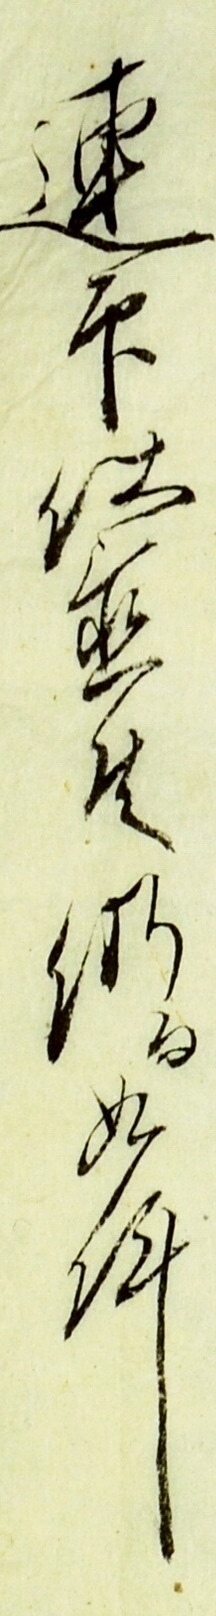連印仕置候仍而如件
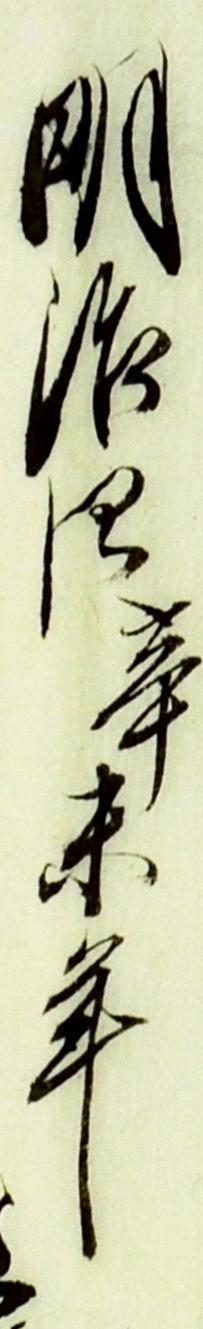明治四辛未年
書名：乍恐以書付奉願上候御事
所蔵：伊那市立高遠町図書館・合同会社AMANE
